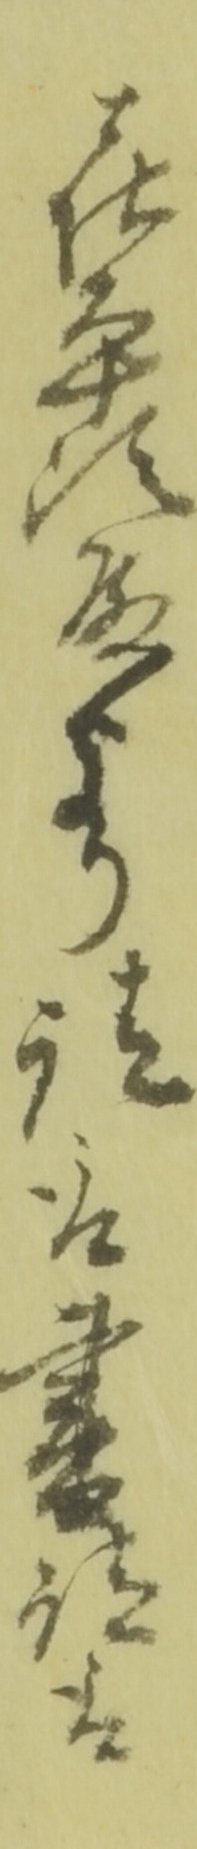喜平次殿より請取書請取
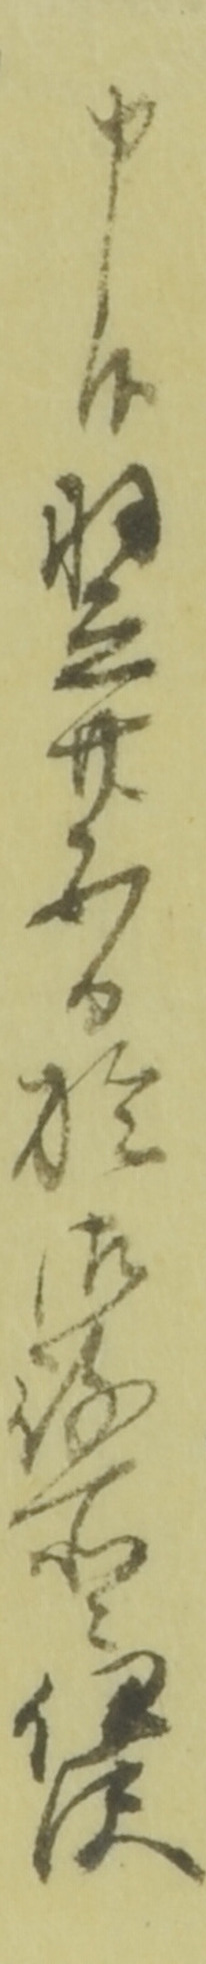申候翌廿五日於御役所ニ伊沢
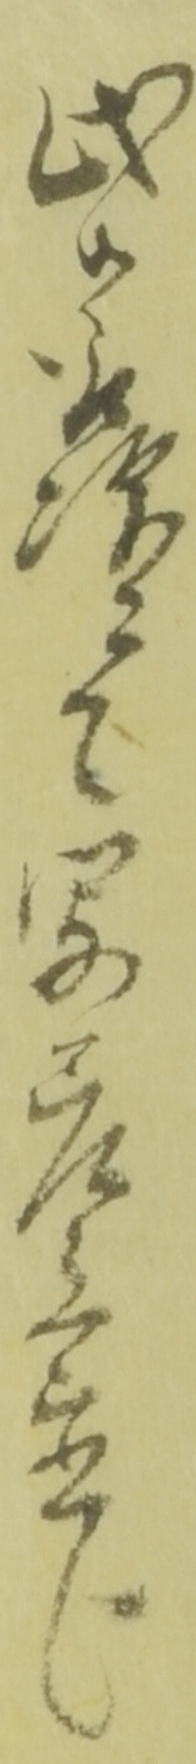氏御取次ニて写差上置申候

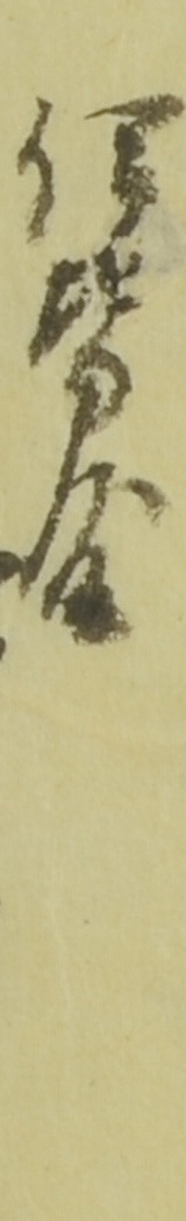伊勢屋
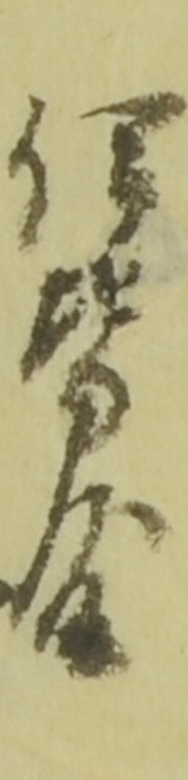伊勢屋
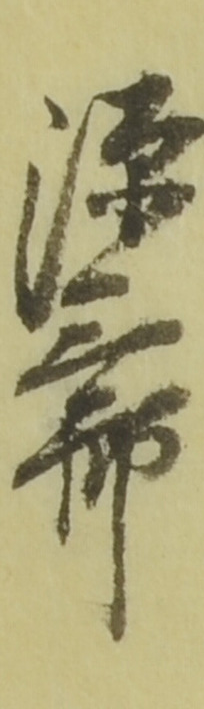源三郎
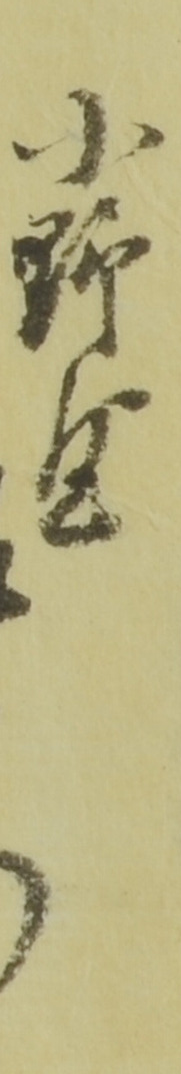小野屋
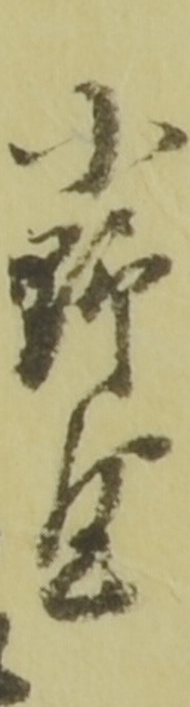小野屋
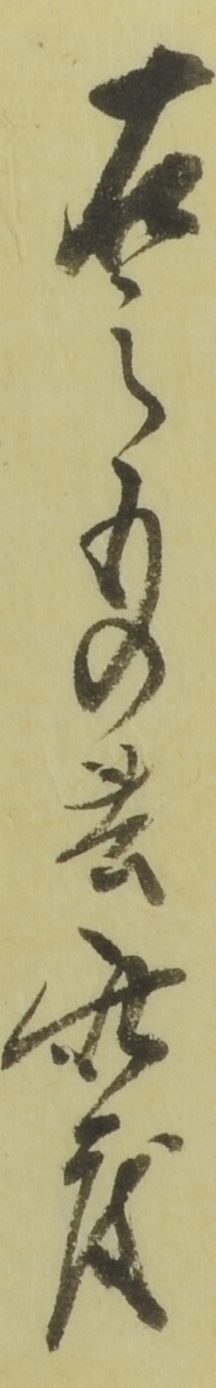右之もの共此度
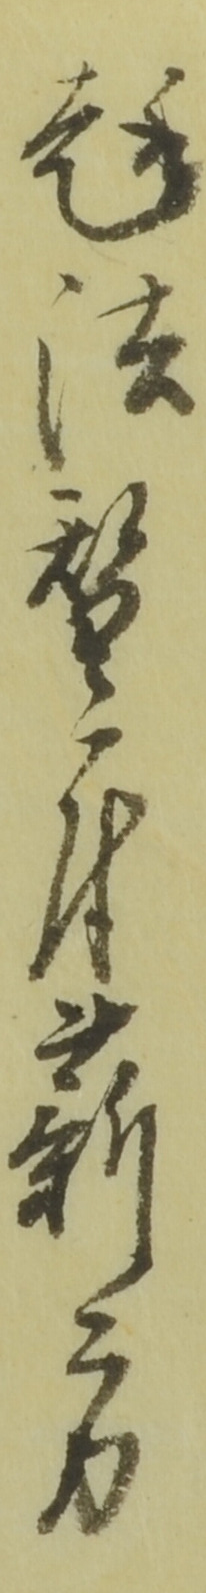趣法替ニ付薪方
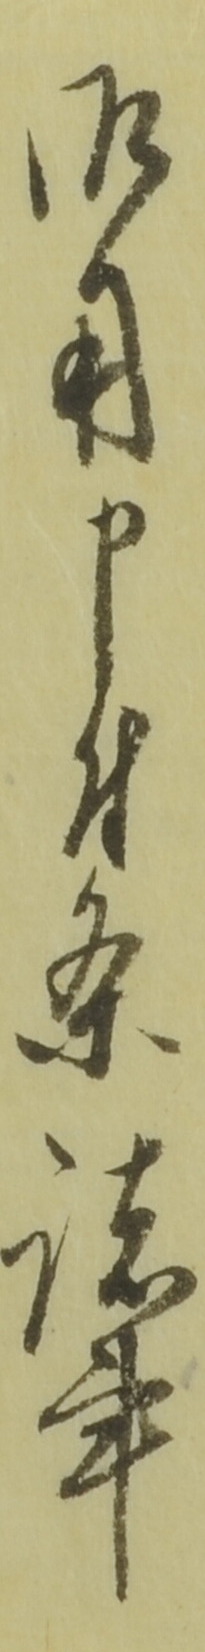御用申付条諸事
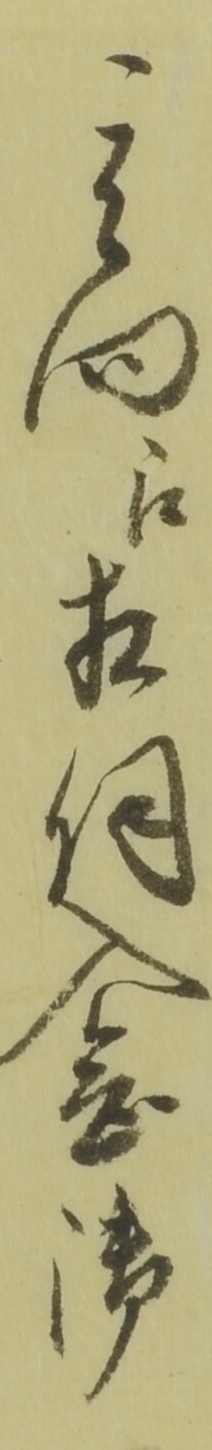之向江相伺入念御
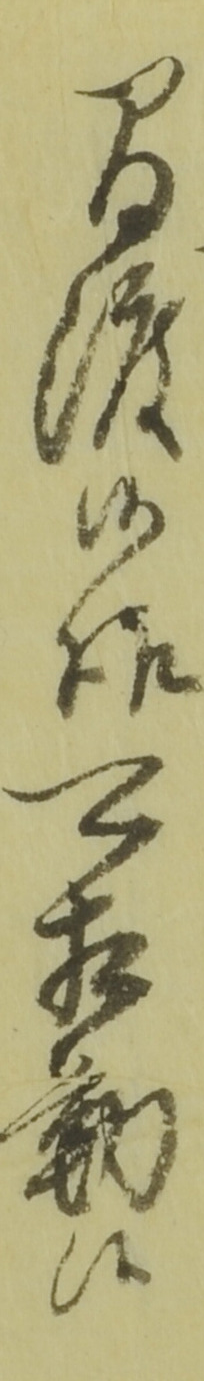間渡候趣可相勤候
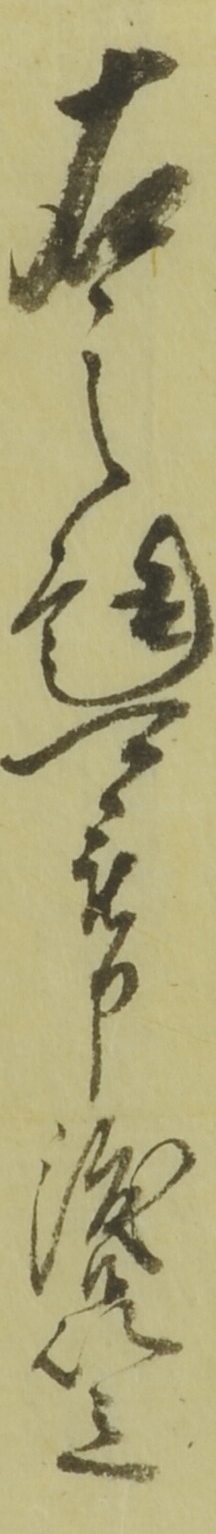右之趣可被申渡候以上
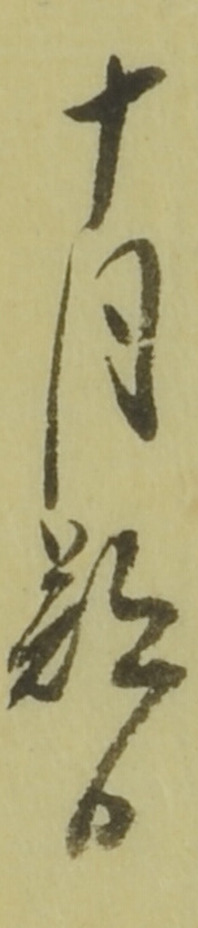十月朔日
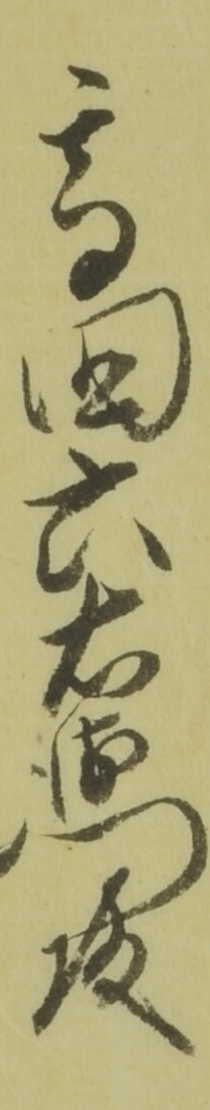高田六右衛門殿
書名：御触書御書附控
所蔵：伊那市立高遠町図書館・合同会社AMANE
